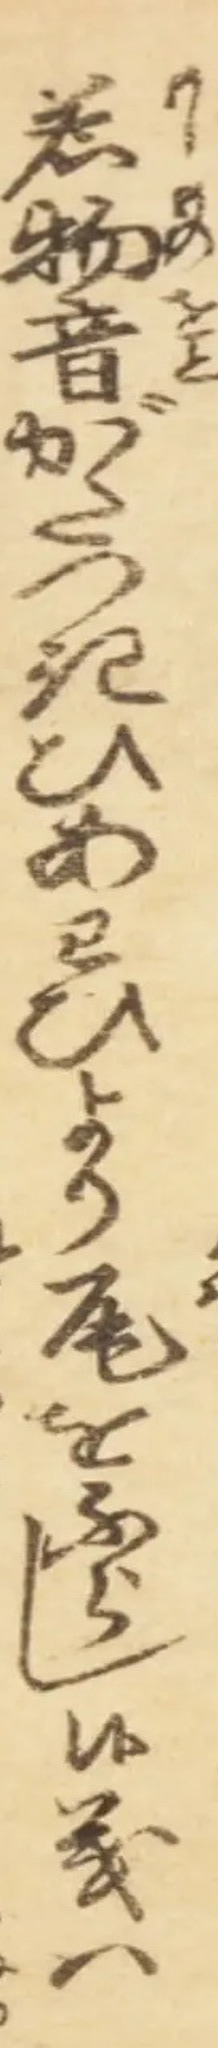若物音がたつきひめわひより瓦をふらし候義は
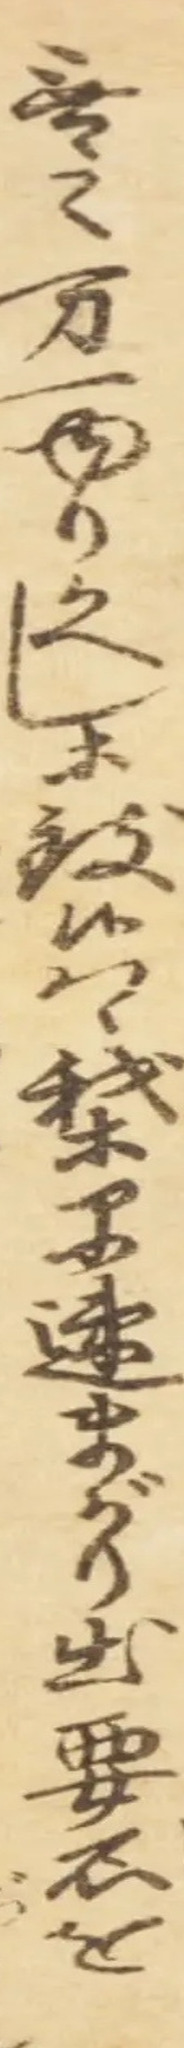無之万一ゆりかへし等致候はゝ我等早速まがり出要石を
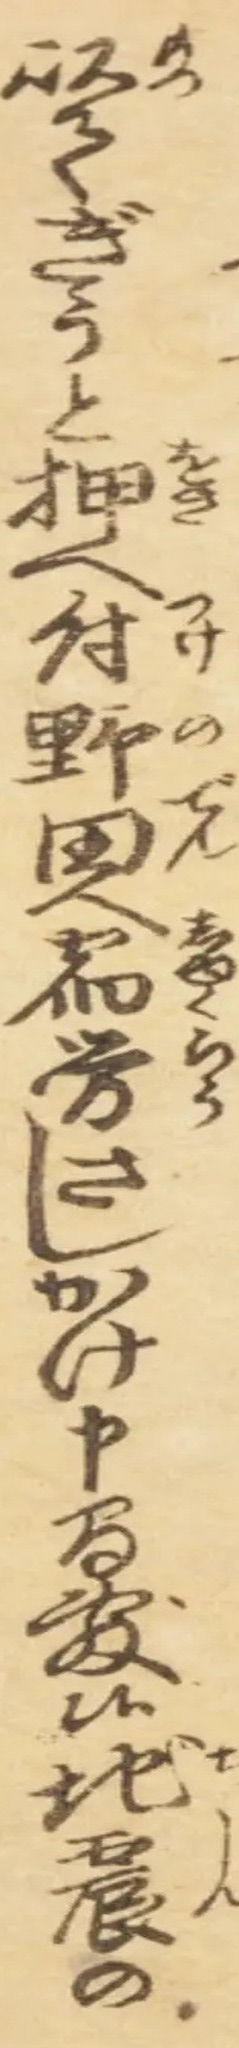以てぎうと押へ付野田へ宿労さしかけ申間敷候地震の
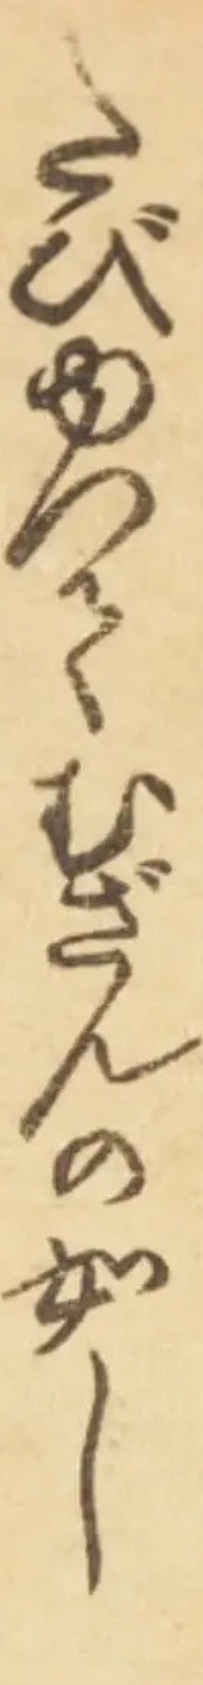たびゆつてむざんの如し
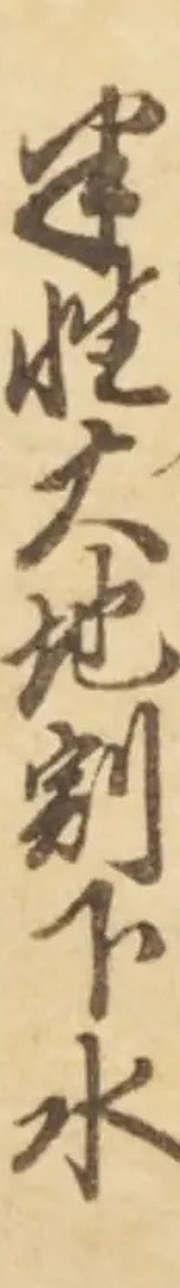半性大地割下水
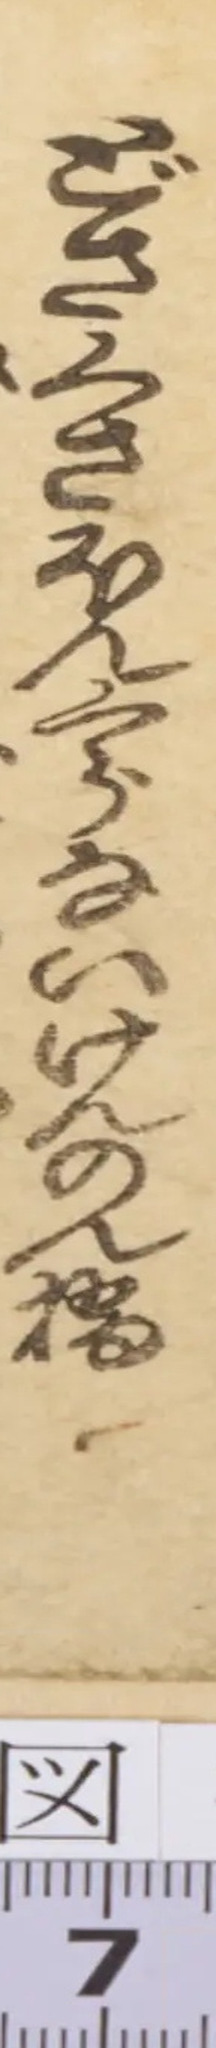どさくさほんつらないけんのん橋
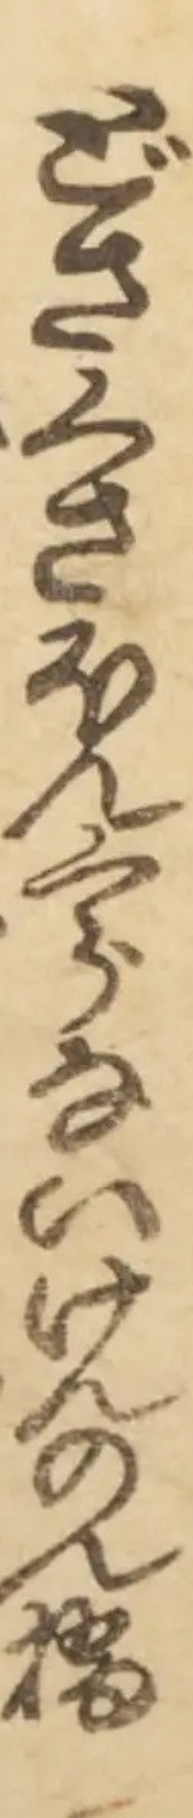どさくさほんつらないけんのん橋
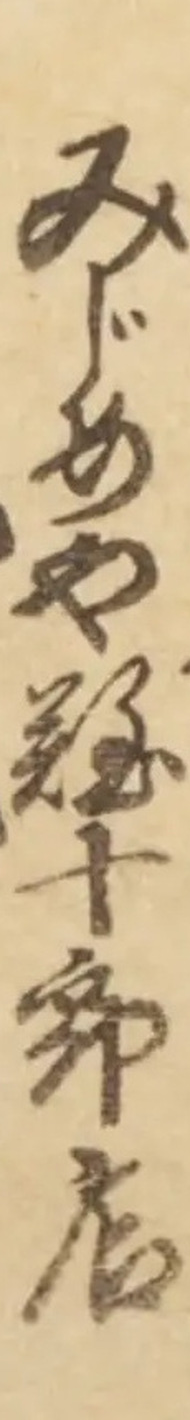みじめや難十郎店
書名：地震方々人迯状之事
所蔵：国立国会図書館 National Diet Library, JAPAN
